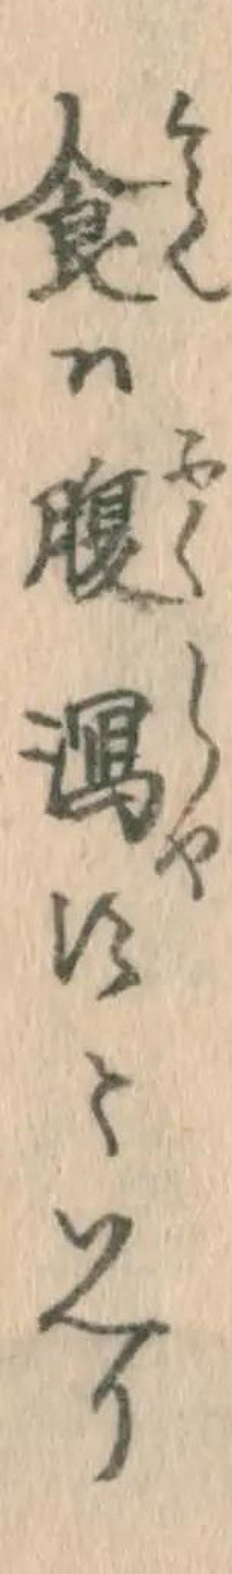食は腹瀉すといへり
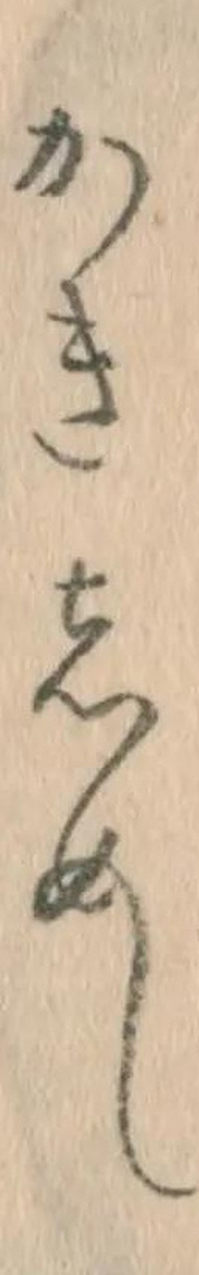かきしめし
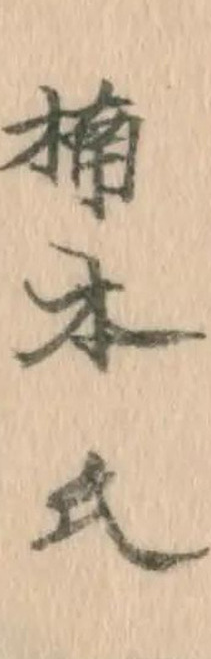楠本氏
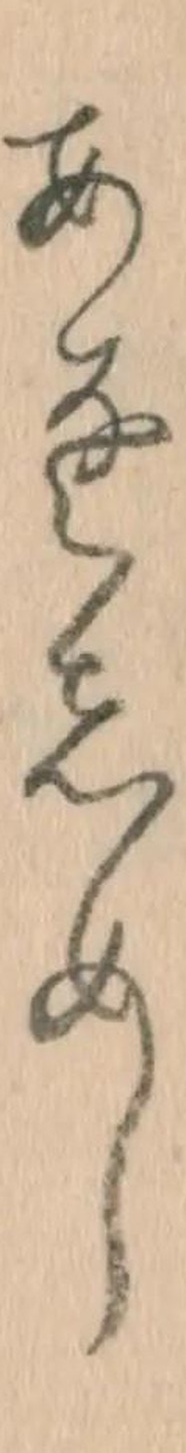あをしめし
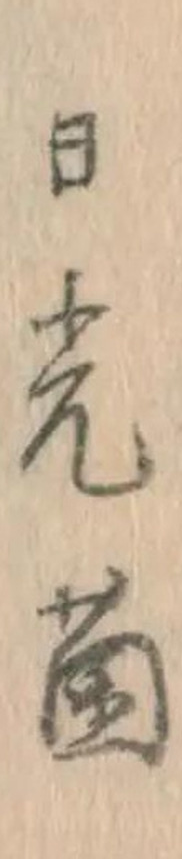日光菌
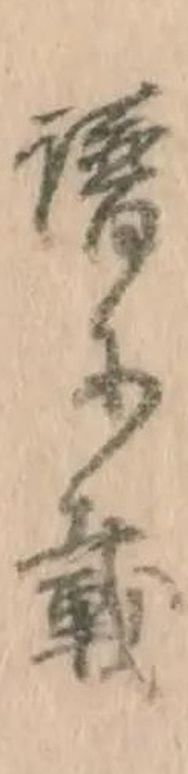譜に載
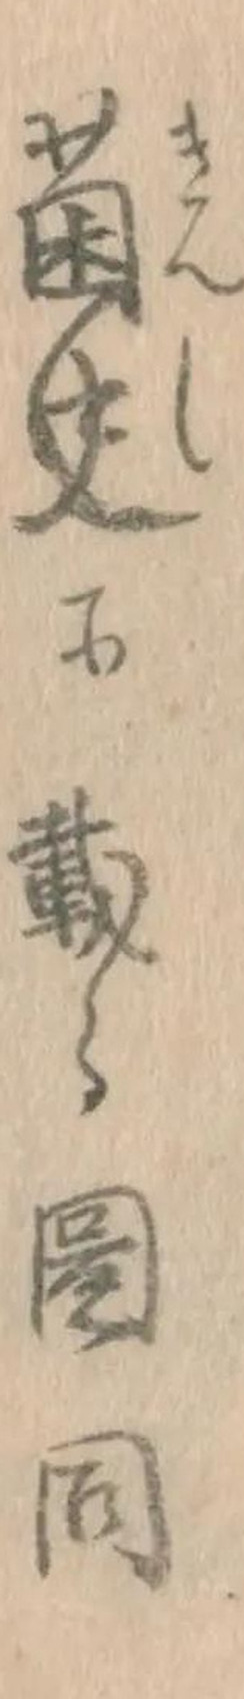菌史に載る図同
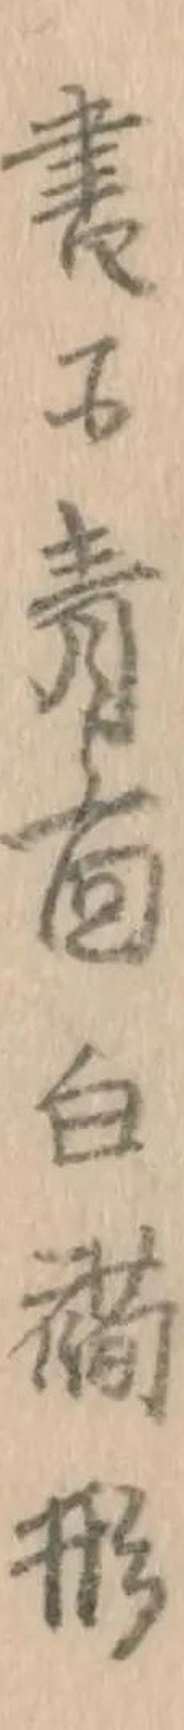書に青面白形
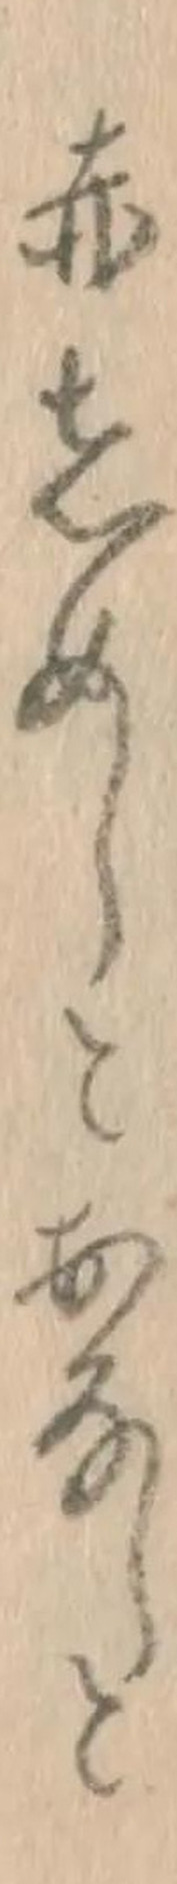赤しめしとおなしと

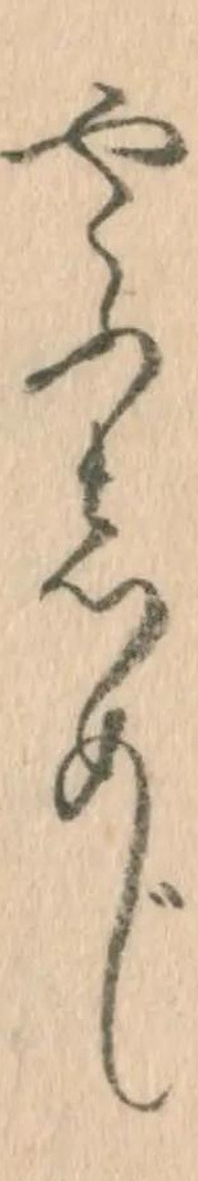やふしめじ
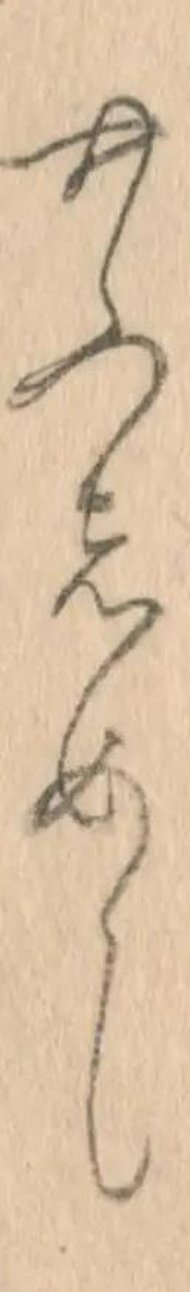やふしめし
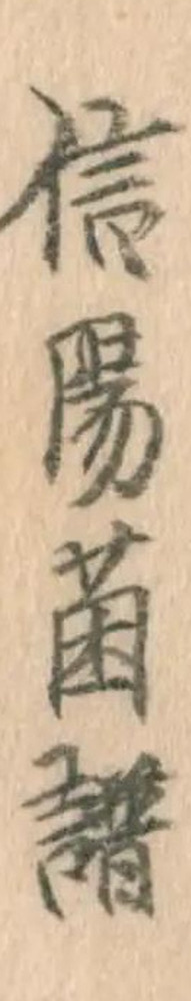信陽菌譜
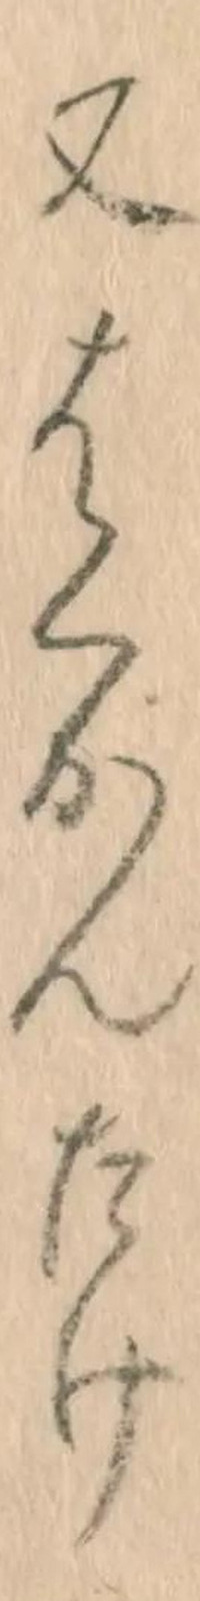又はくかんたけ
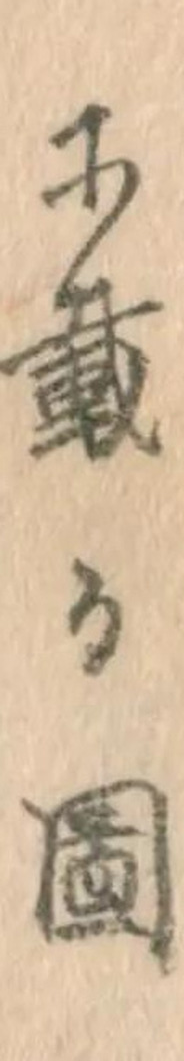に載る図
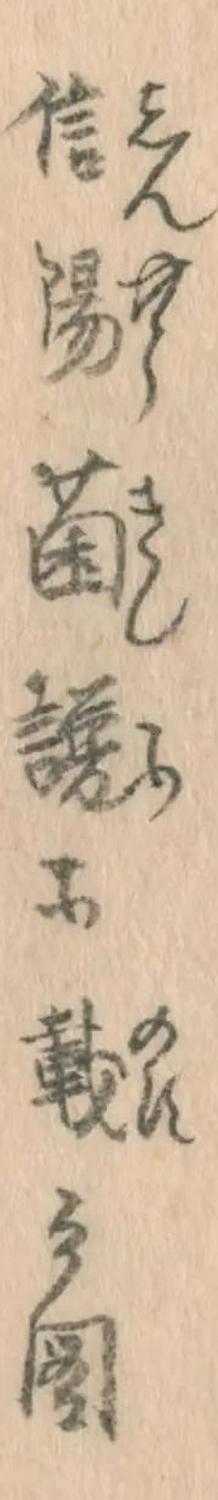信陽菌譜に載る図
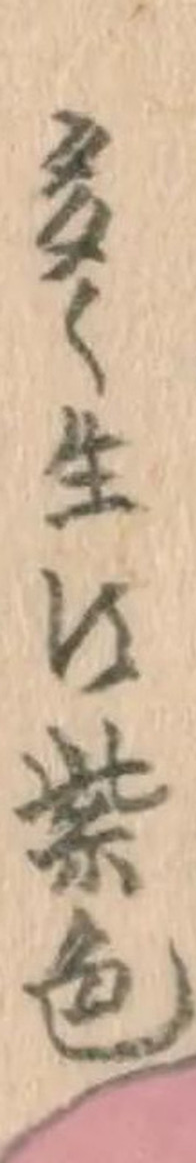多く生す紫色
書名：本草図譜. 巻55-57
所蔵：国立国会図書館 National Diet Library, JAPAN
